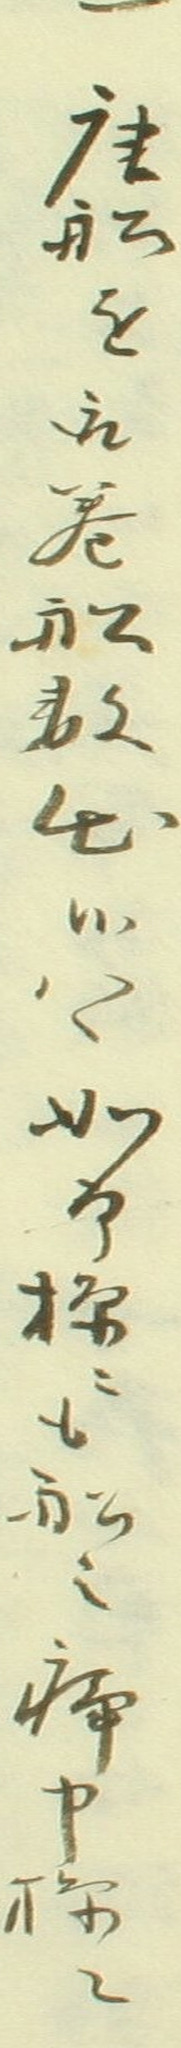一唐船を取巻船数出候はは如何様にも船之痛申様に
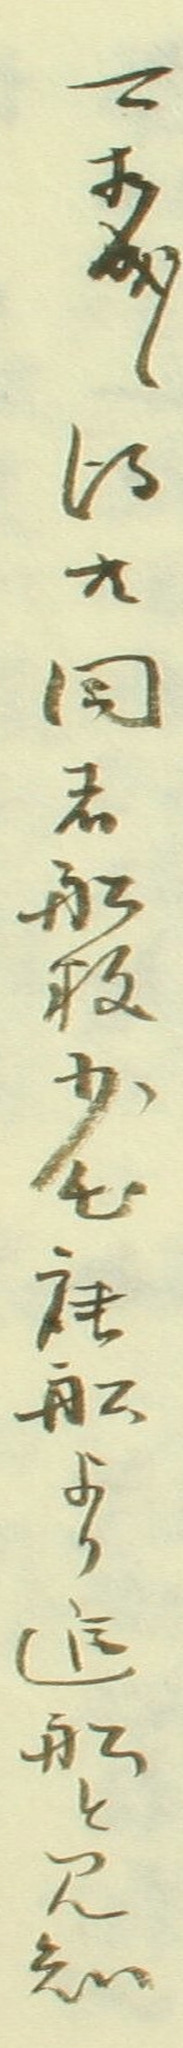可相成候得共同者船数少出唐船より追船と見知
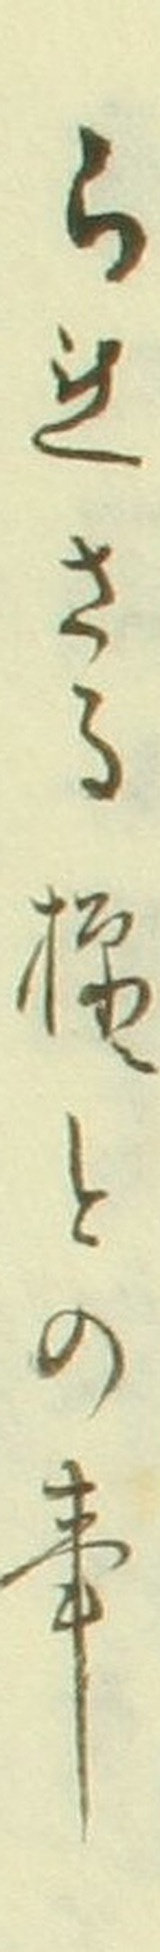られさる様にとの事
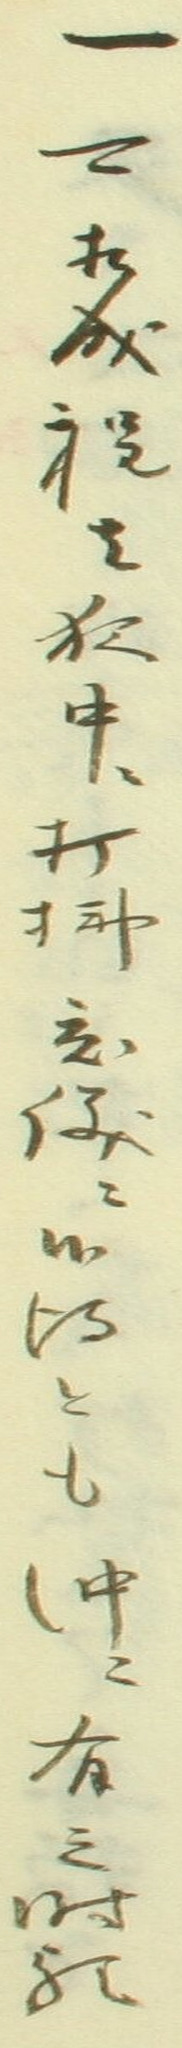一可相成程は夜中に打払之儀に候得とも沖に有之時預

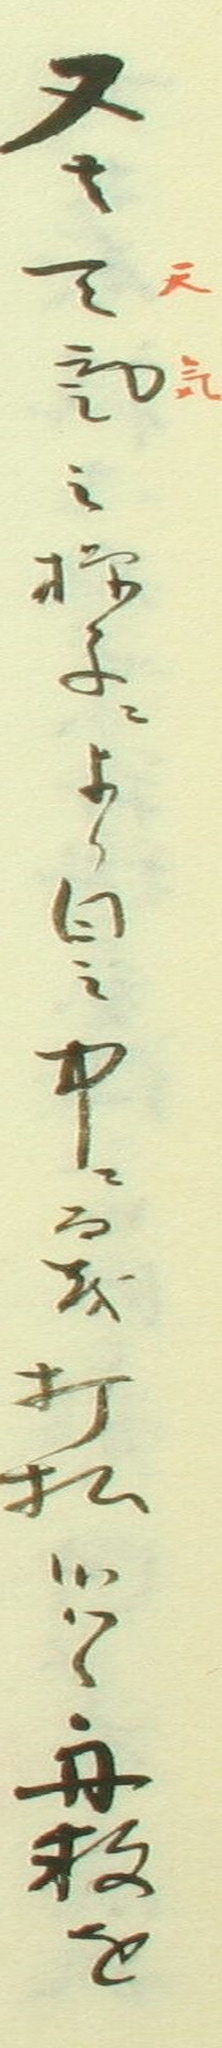又は天気之様子により自之中に而茂打払候はは舟数を
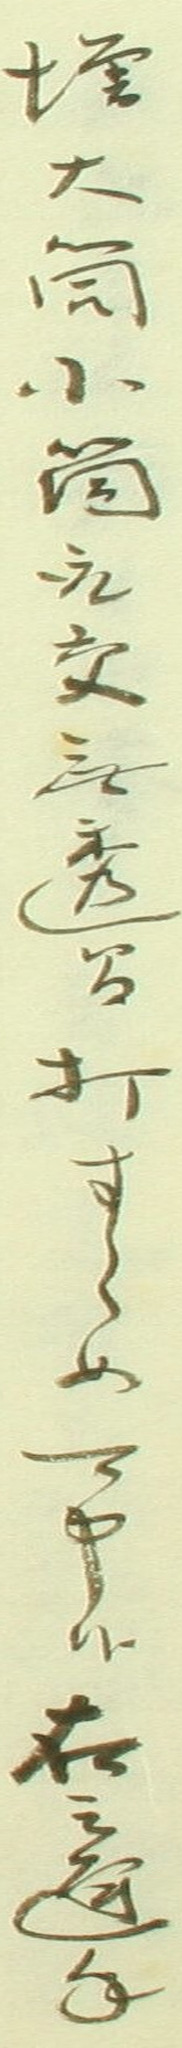増大筒小筒取交無透間打すくめ可申候右之？年
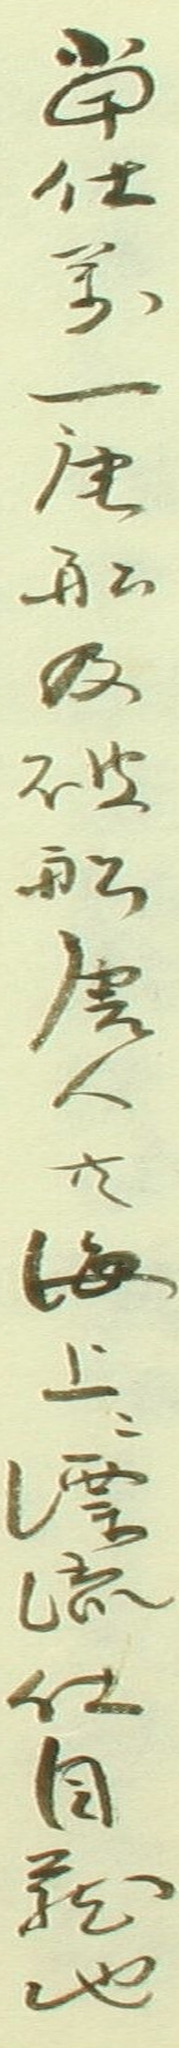？仕萬一唐船及破船唐人共海上に漂流仕自蔵池
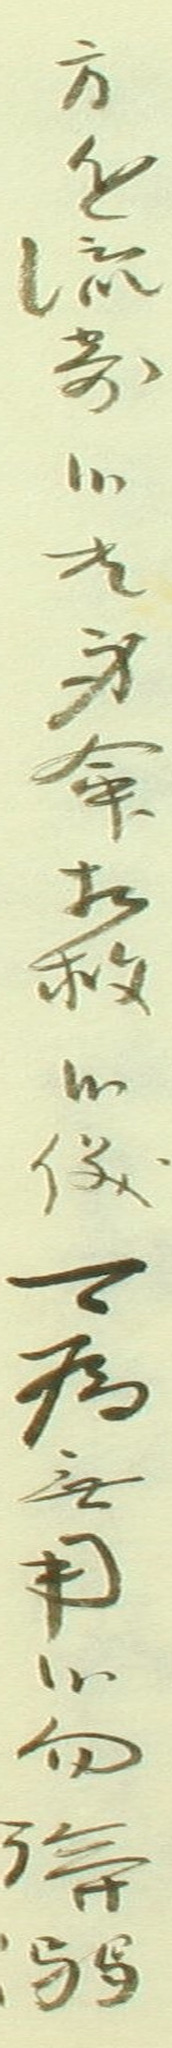方を流寄候共身命相救候儀可為無用候勿論溺
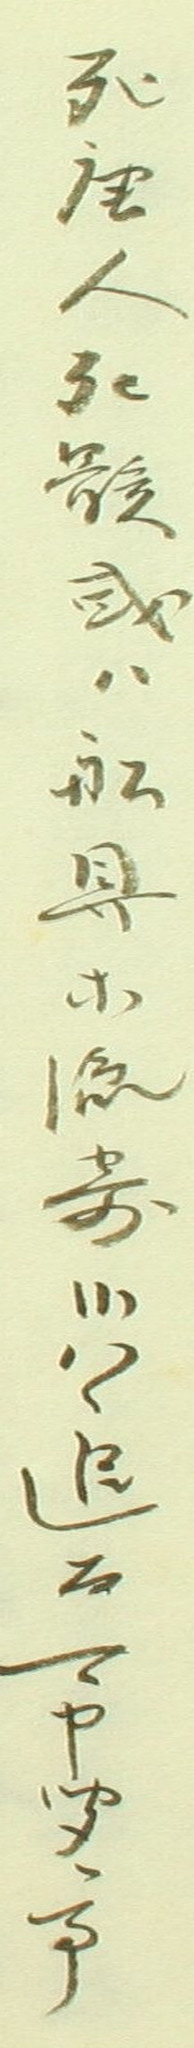死唐人死骸或は船具等流寄候はは追而可申聞候事
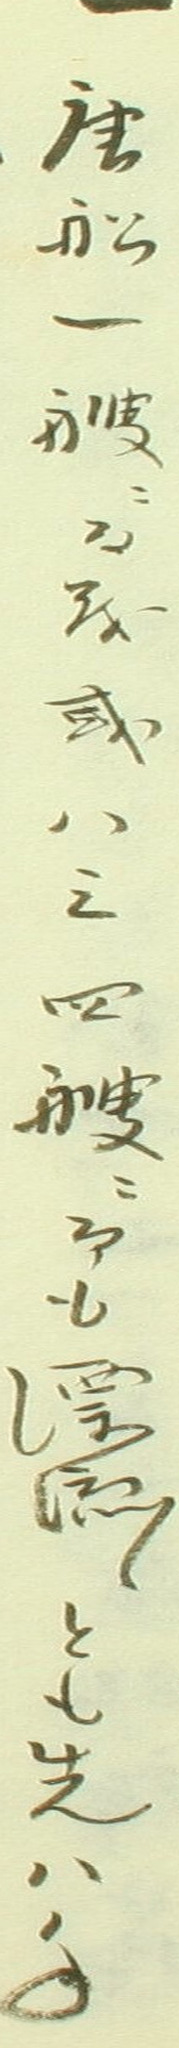一唐船一艘に而越或は三四艘に而も漂流候とも先は年
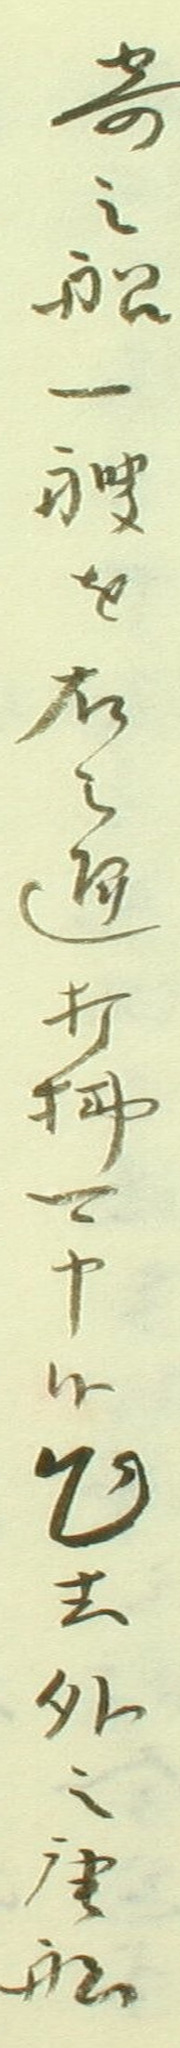寄之船一艘を右之通打払可申候趣其外之唐船
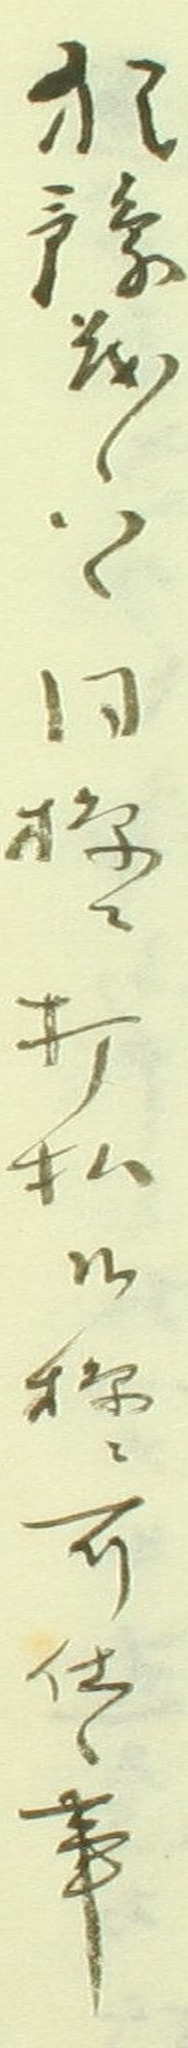猶？茂候はは同様に打払候様に可仕候事
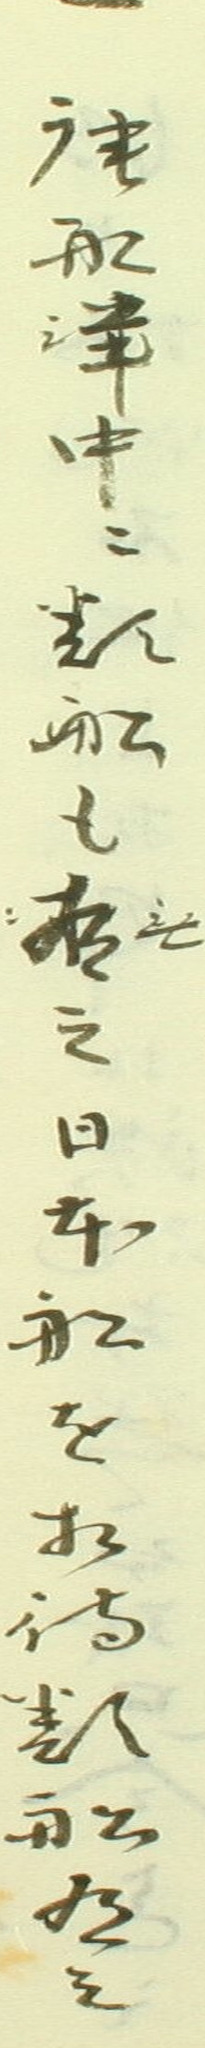一唐船津中に類船も？之日本船を相待類船有之
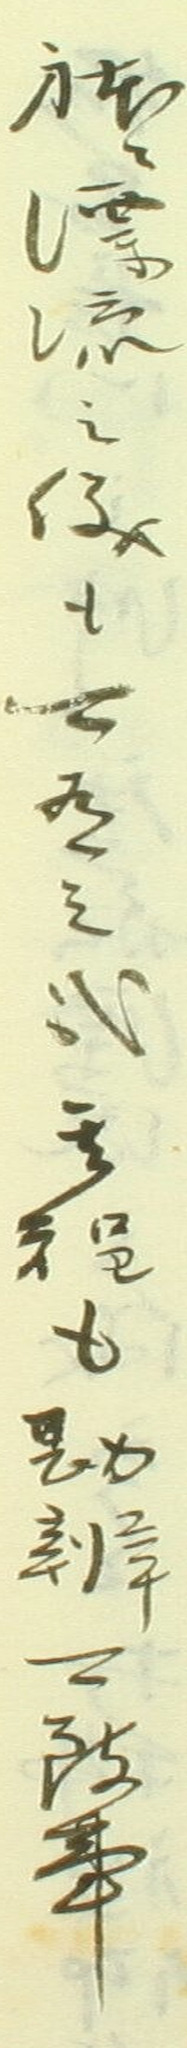躰に漂流之儀も可有之哉其程も勘弁可致事
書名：唐船漂流記 三
